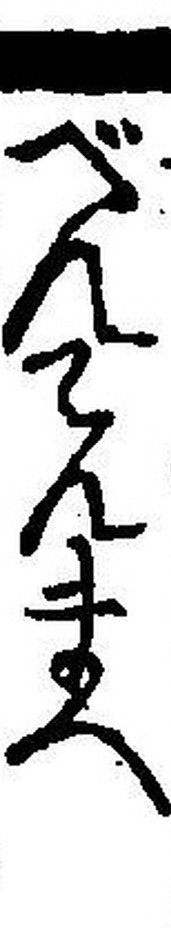べんてんまへ
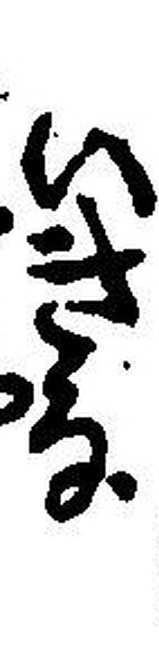いきな
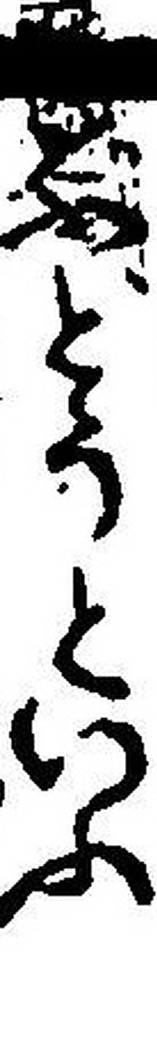ふどうといふ
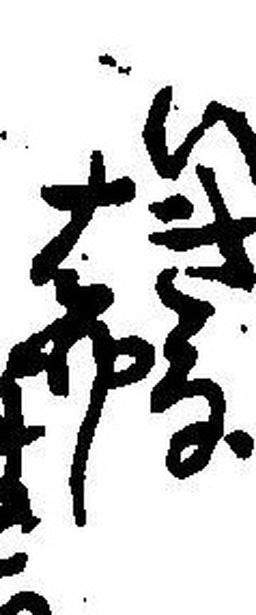はなし
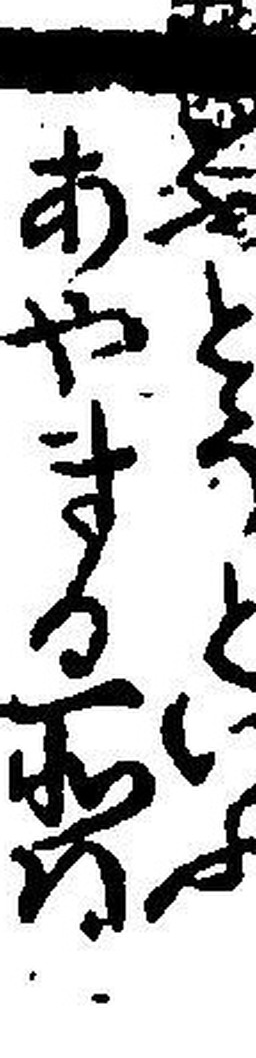あやまる所は
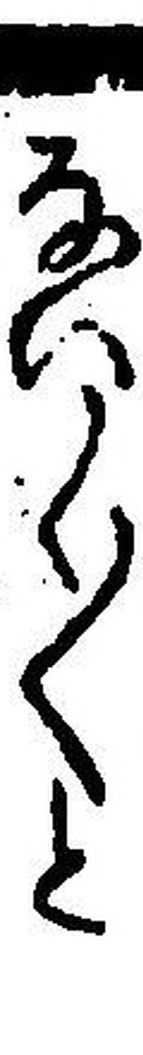ない〳〵〳〵と
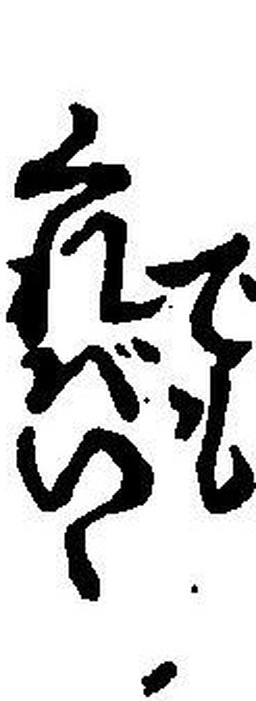くればいゝ
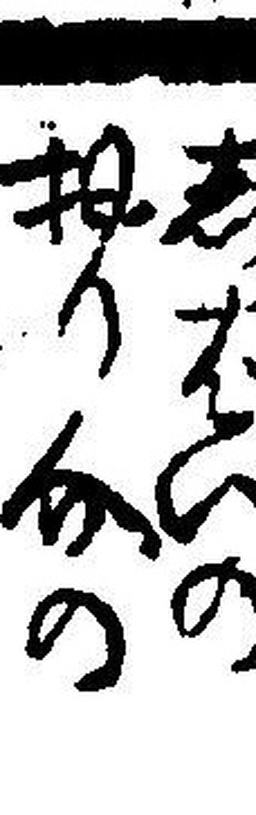おり介の
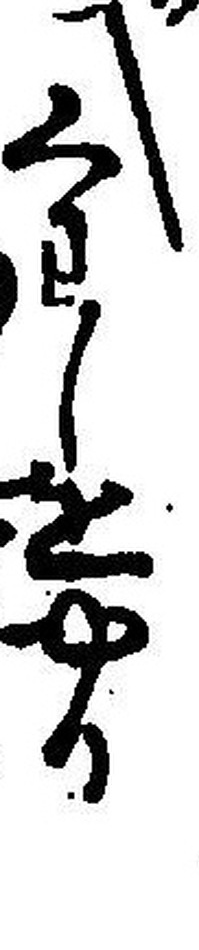〽くわしをやる
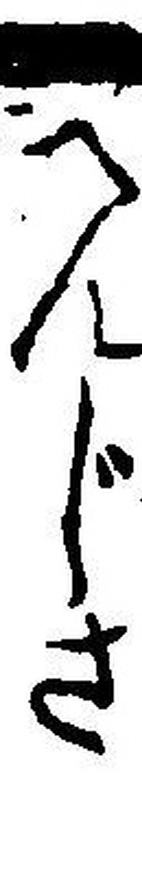へんじさ
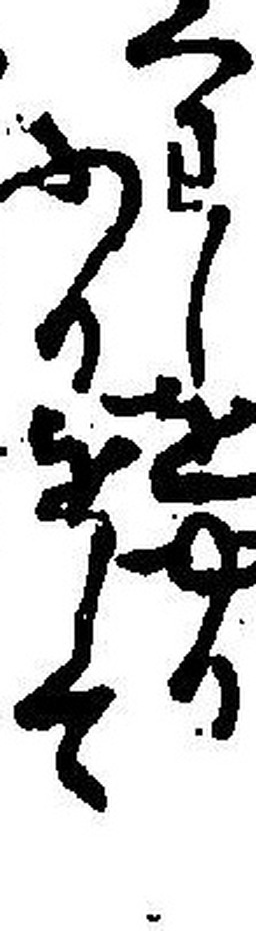ふりをして
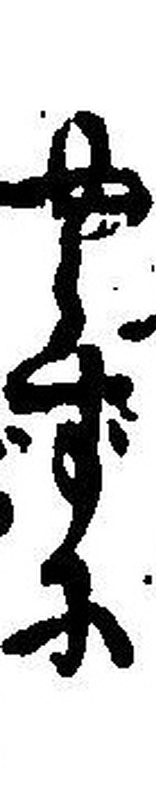やらずに
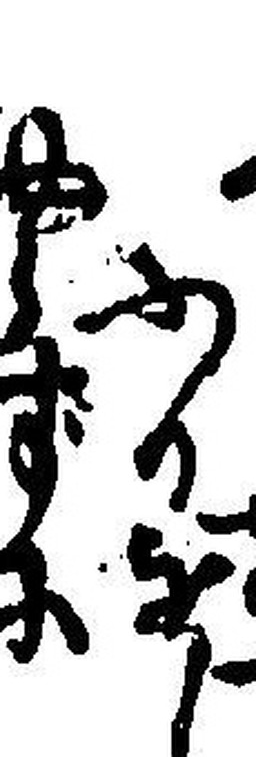やらずに
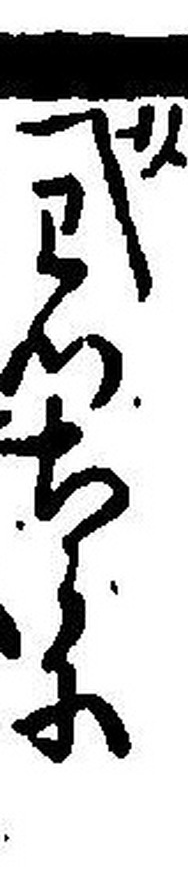〽わつちらに
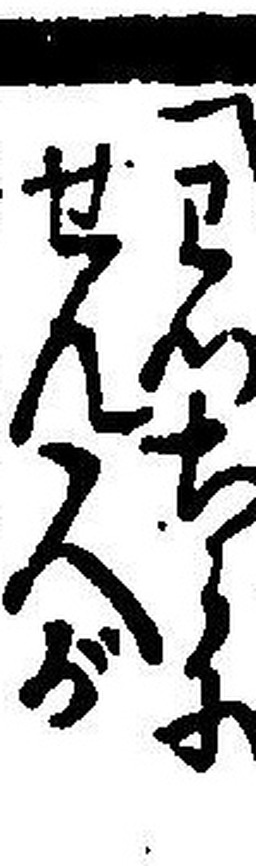せん人が
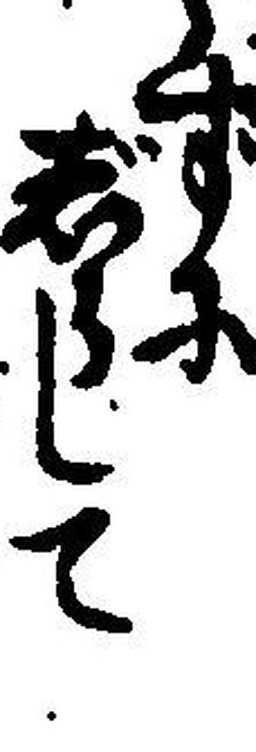じらして
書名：徳若水縁起金性 / 樹下石上作
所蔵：東京大学総合図書館 General Library in the University of Tokyo, JAPAN
